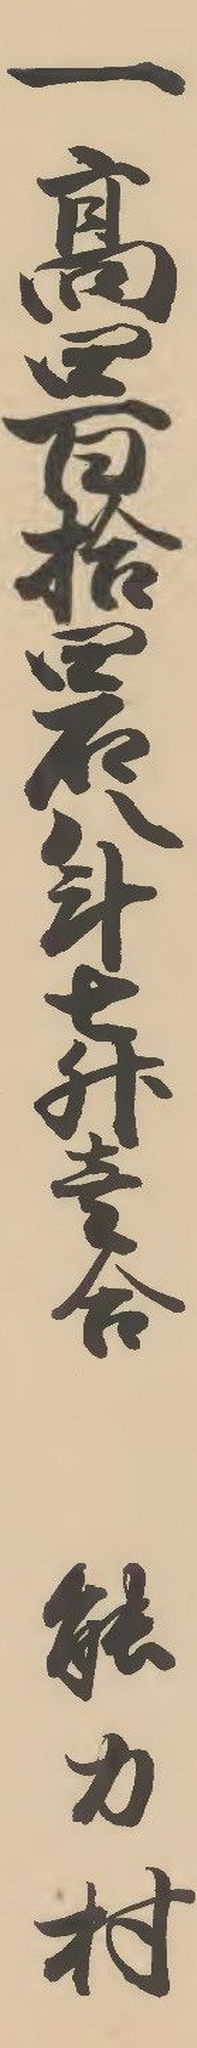一高四百拾四石八斗七升壱合能力村
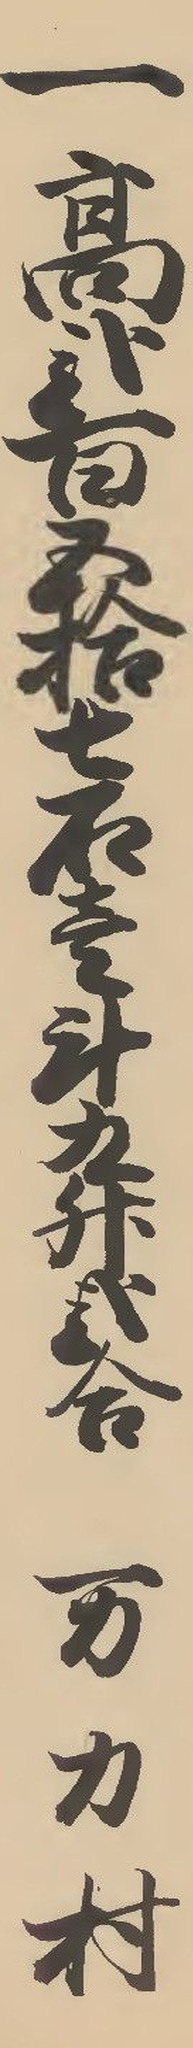一高弐百五拾七石壱斗九升弐合万力村
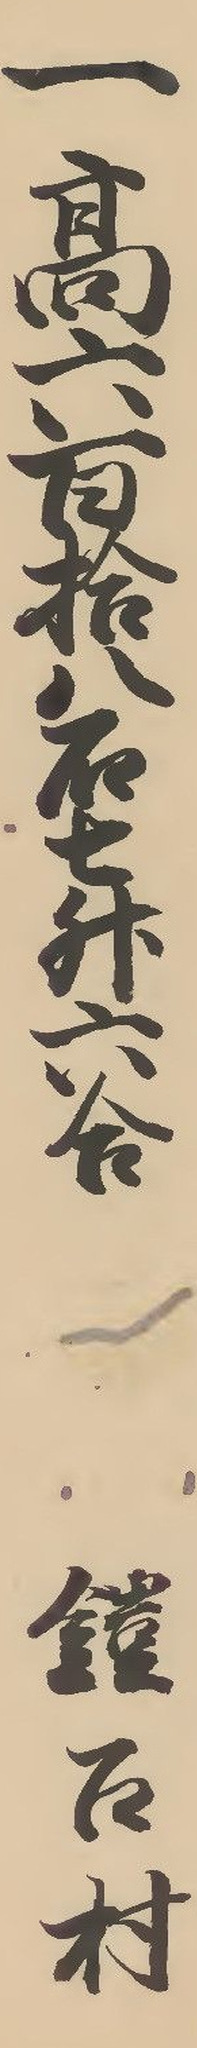一高六百拾八石七升六合鎧召村

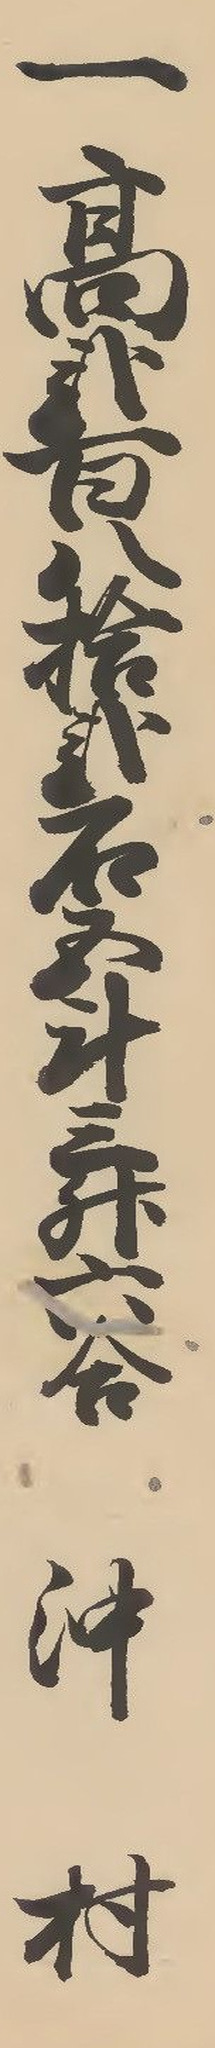一高弐百八拾弐石五斗三升六合沖村
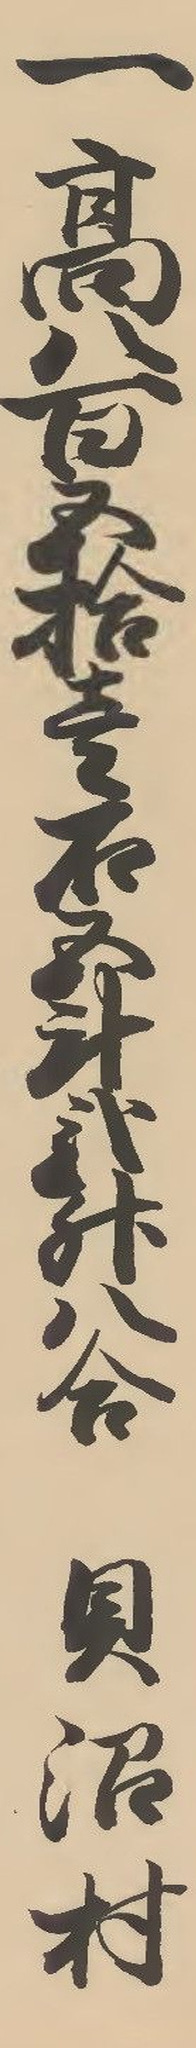一高八百五拾壱石五斗弐升八合貝沼村
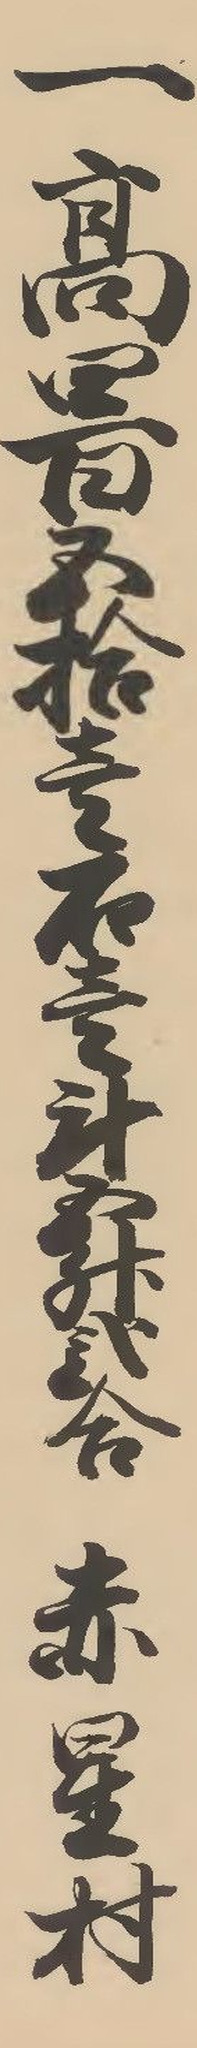一高四百五拾壱石壱斗五升弐合赤星村
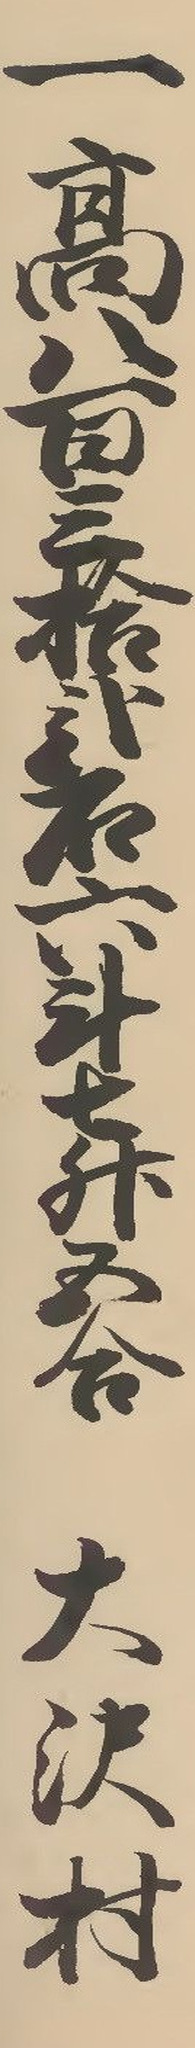一高八百三拾弐六斗七升五合大沢村
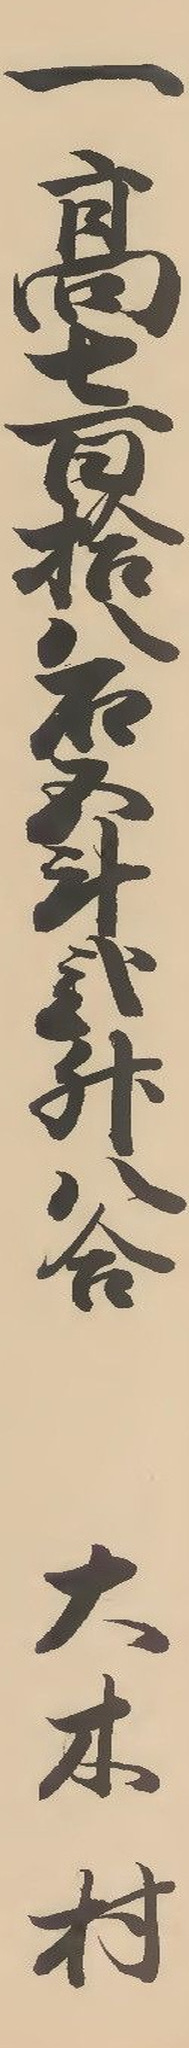一高七百拾八石五斗弐升八合大木村
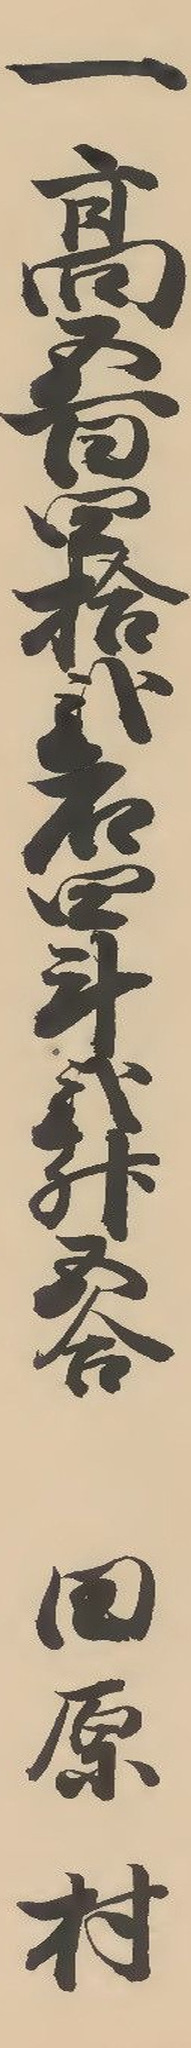一高五百四拾弐石四斗弐升五合田原村
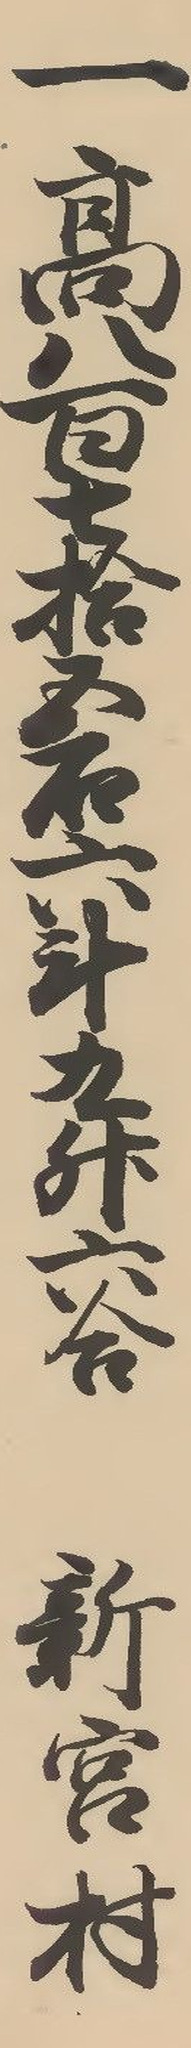一高八百七拾五石六斗九升六合新宮村
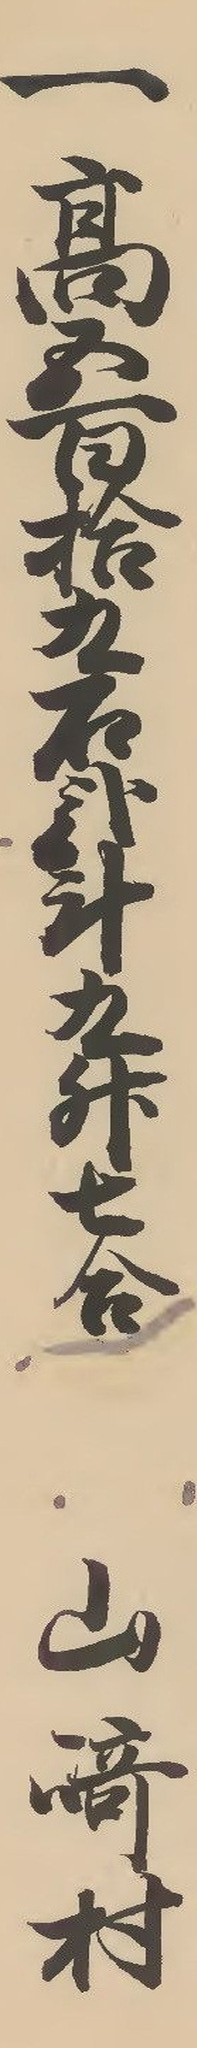一高五百拾九石弐斗九升七合山崎村

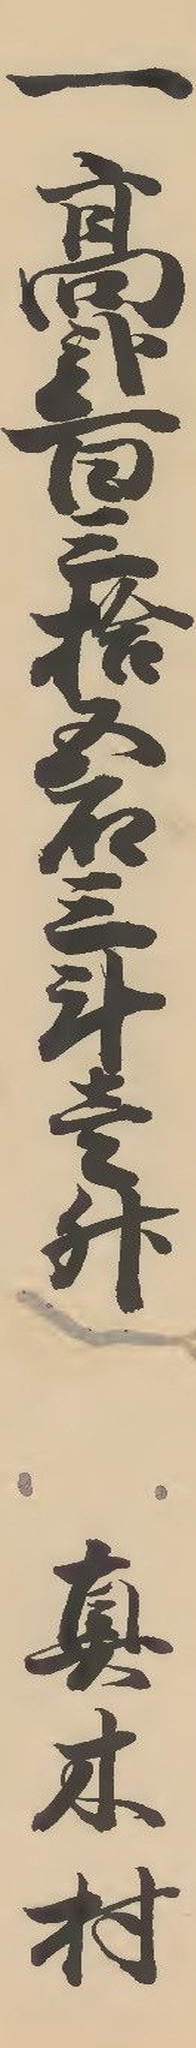一高弐百三拾五石三斗壱升真木村
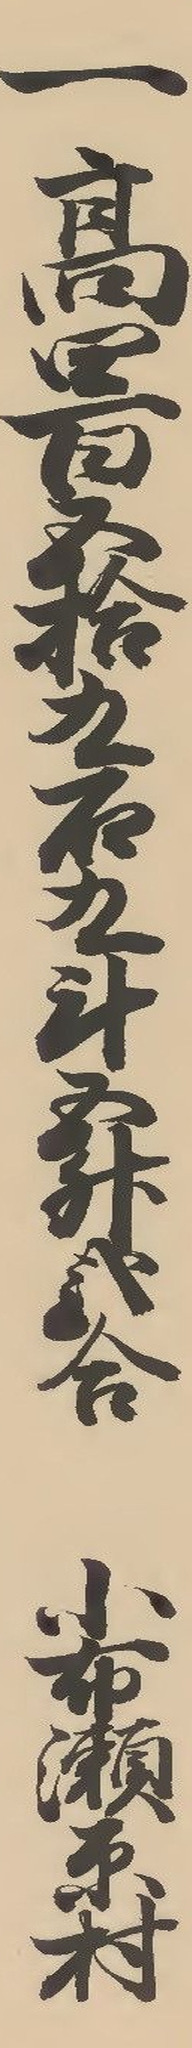一高四百五拾九石九斗五升弐合小布瀬原村
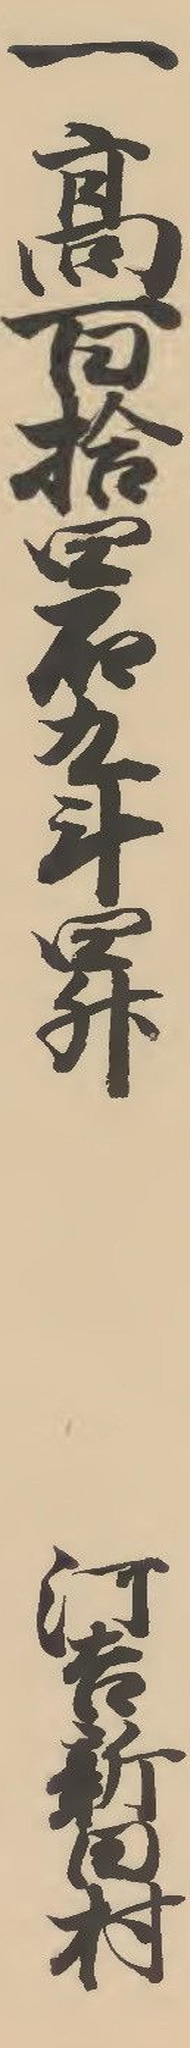一高百拾四石九斗四升河吉新田村
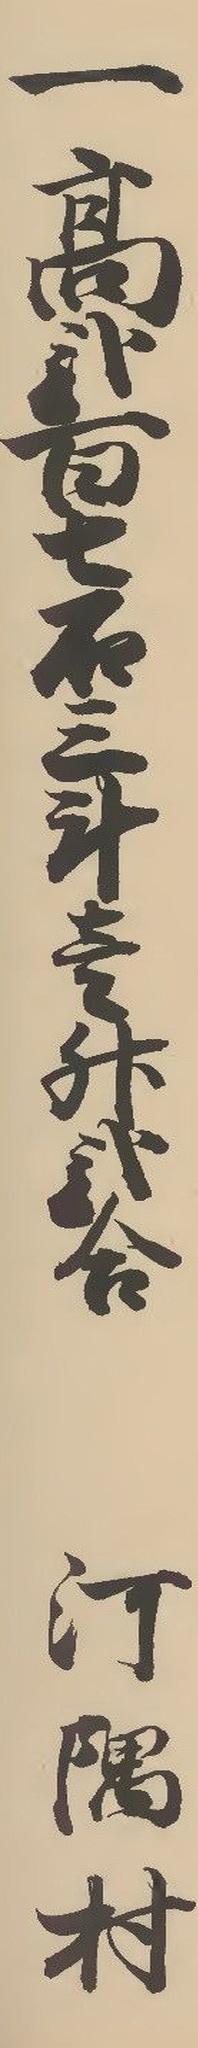一高弐百七石三斗壱升弐合河隅村
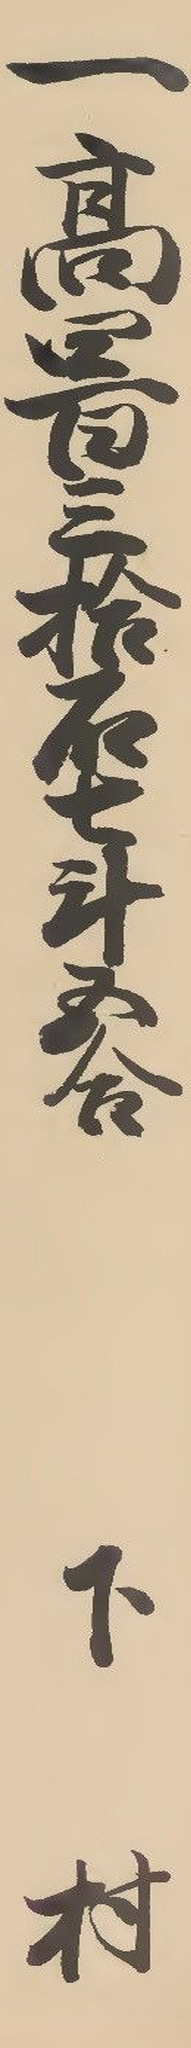一高四百三拾石七斗五合下村
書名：陸奥国郷帳　１
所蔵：国立公文書館 National Archives of Japan
